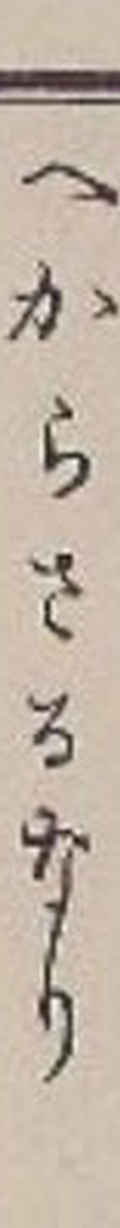へからさるなり
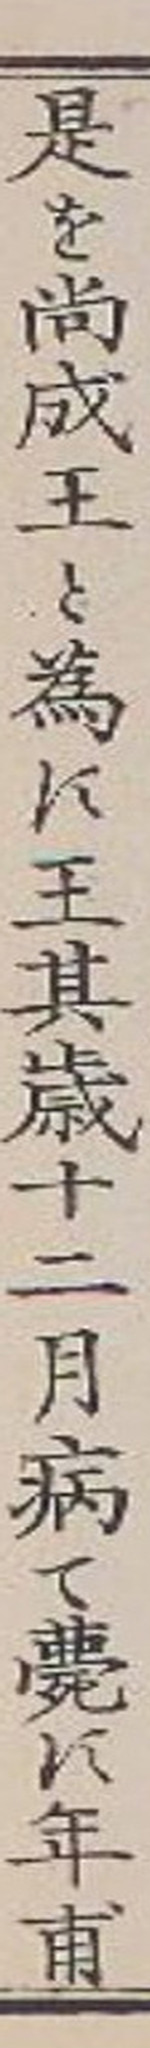是を尚成王と為す王其歳十二月病て薨す年甫
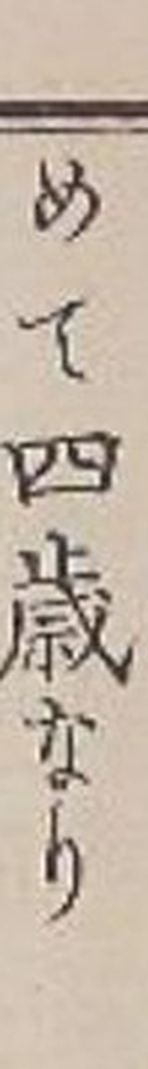めて四歳なり
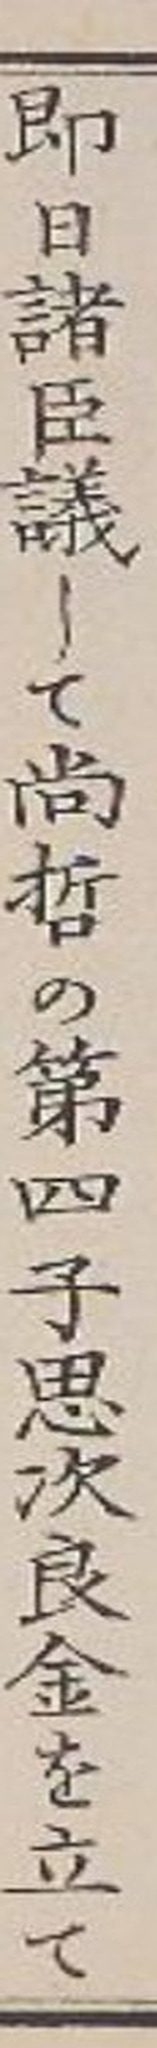即日諸臣議して尚哲の第四子思次良金を立て
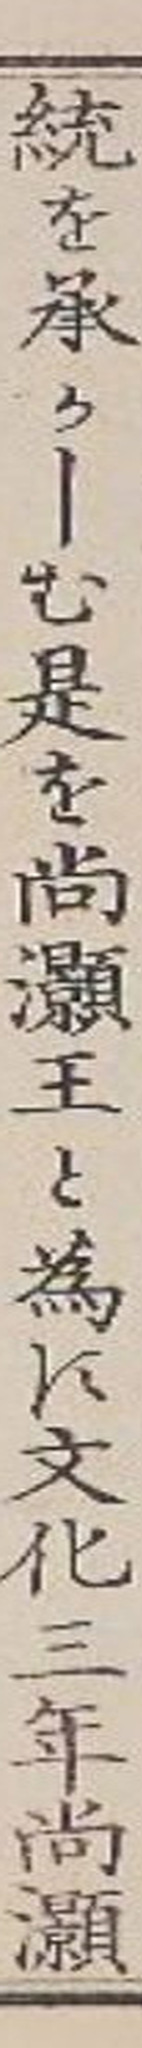統を承かしむ是を尚灝王と為す文化三年尚灝
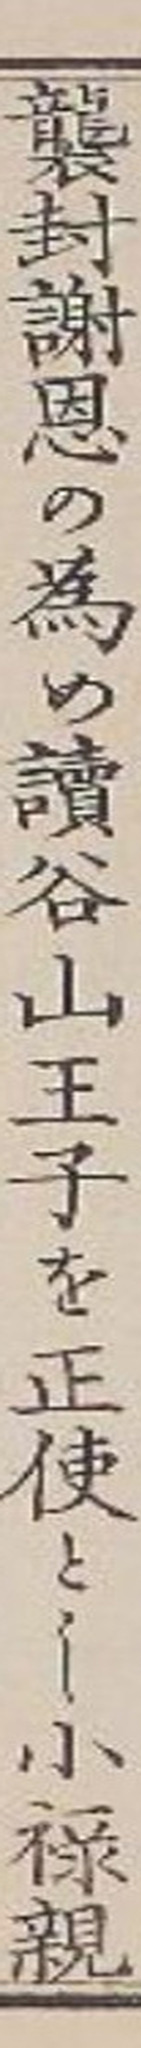襲封謝恩の為め読谷山王子を正使とし小禄親
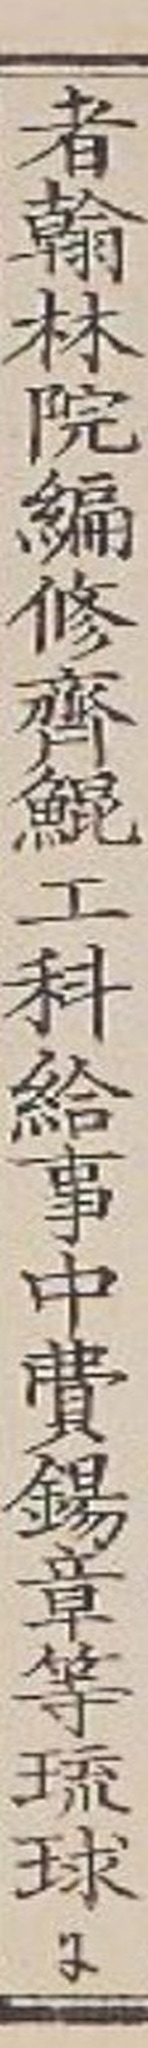者翰林院編修斉鯤工科給事中費錫章等琉球に
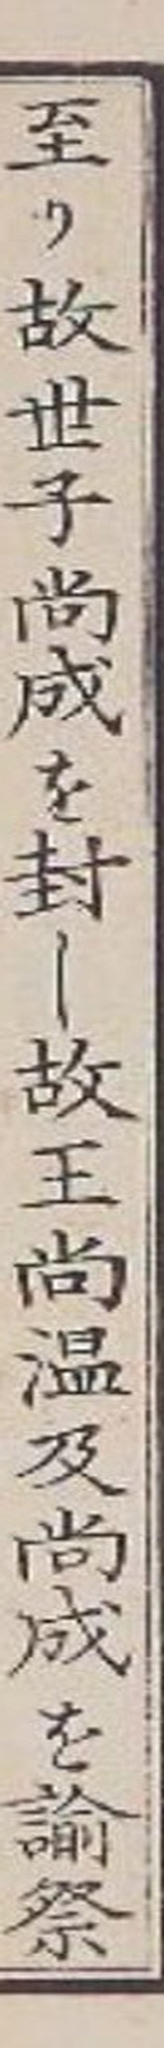至り故世子尚成を封し故王尚温及尚成を諭祭
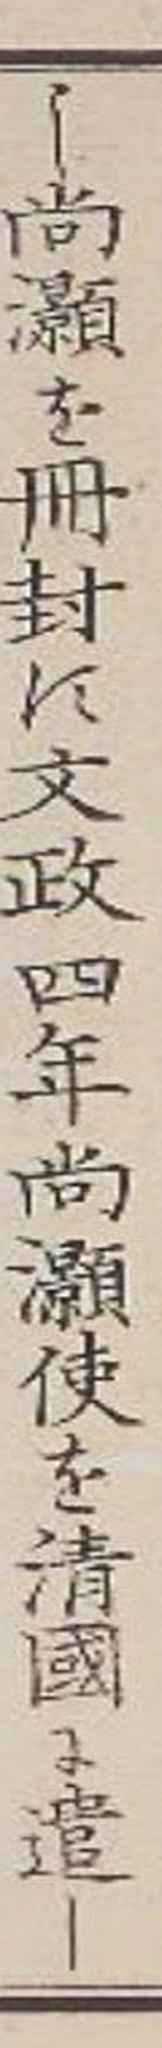し尚灝を冊封す文政四年尚灝使を清国に遣し
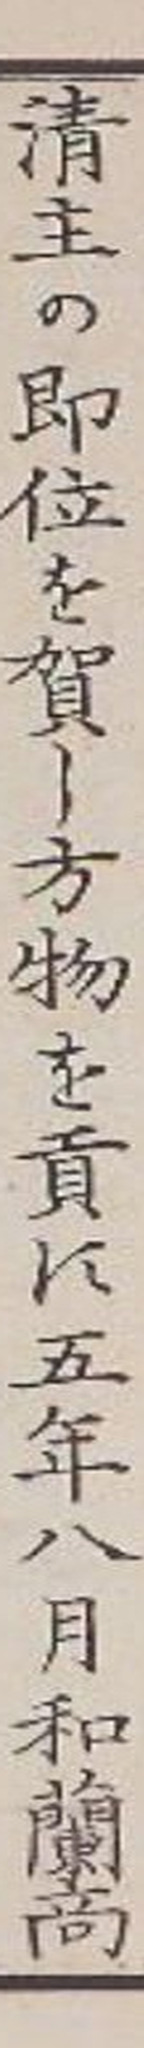清主の即位を賀し方物を貢す五年八月和蘭商
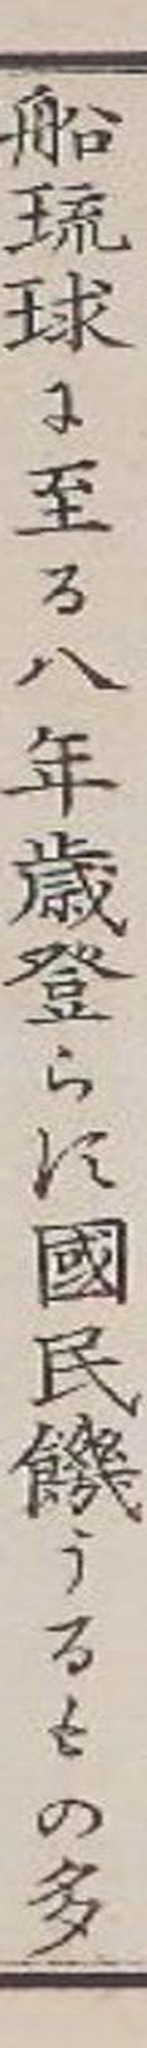船琉球に至る八年歳登らす国民飢うるもの多
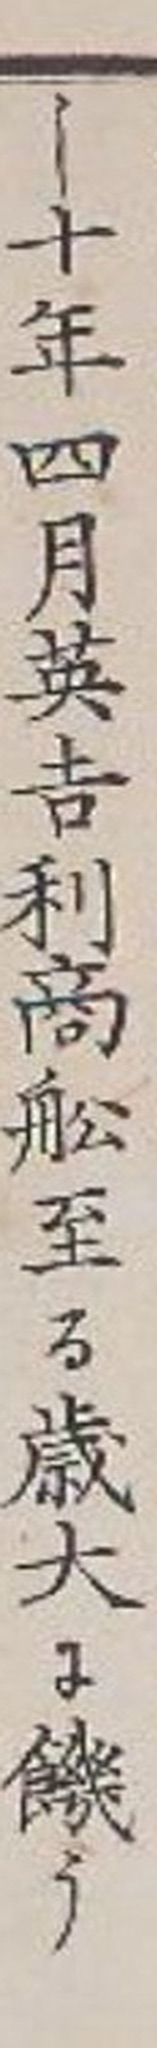し十年四月英吉利商船至る歳大に飢う
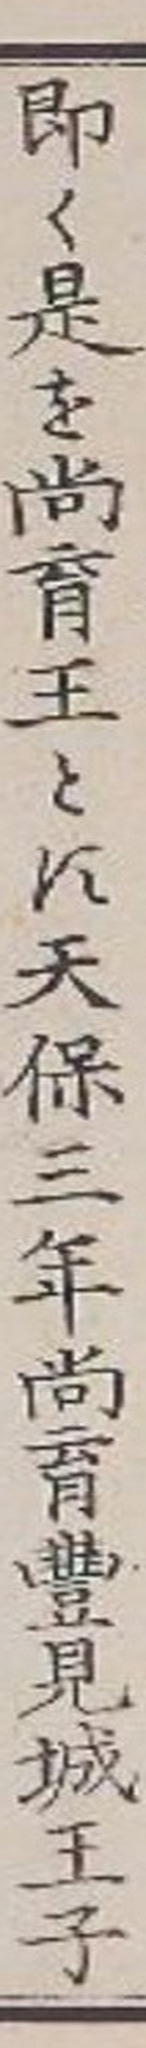即く是を尚育王とす天保三年尚育豊見城王子
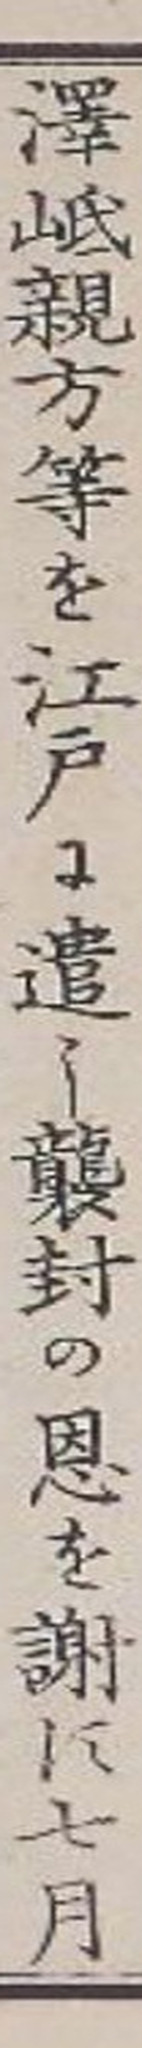沢岻親方等を江戸に遣し襲封の恩を謝す七月
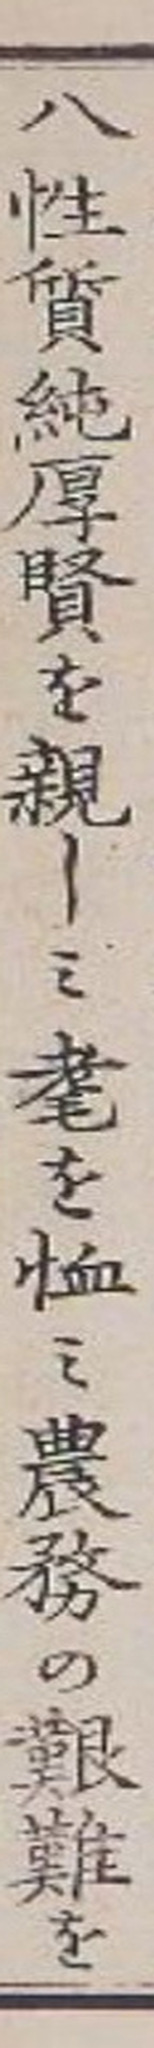八性質純厚賢を親しみ耄を恤み農務の艱難を

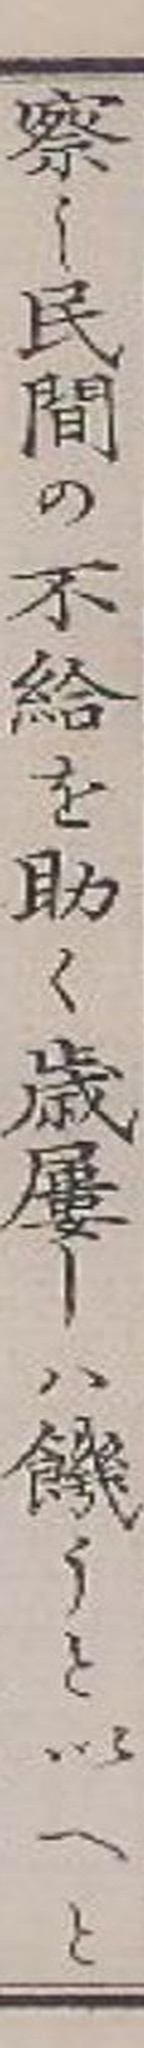察し民間の不給を助く歳屡しは飢うといへと
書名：南島紀事 下
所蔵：University of the Ryukyus Library
